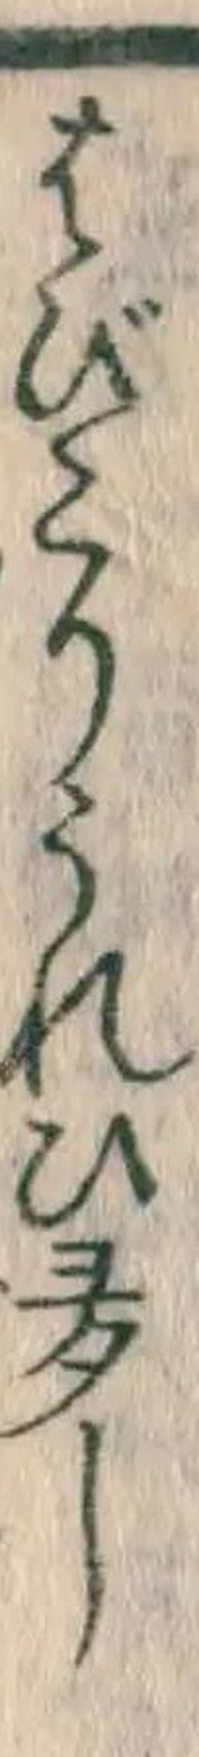はびこりうれひ多し
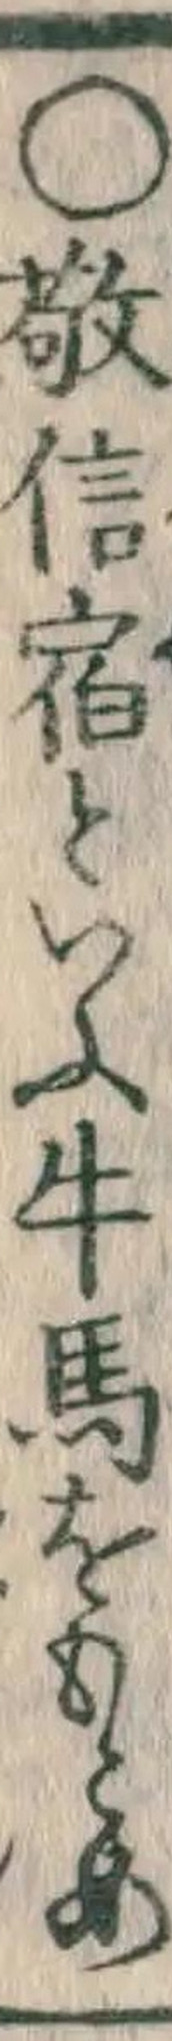○敬信宿といふ牛馬をもとめ
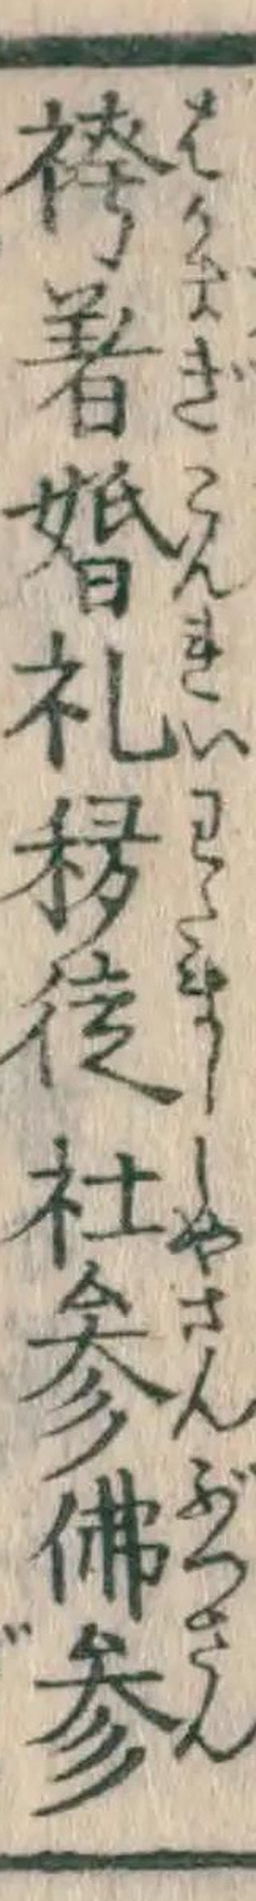袴着婚礼移徒社参仏参
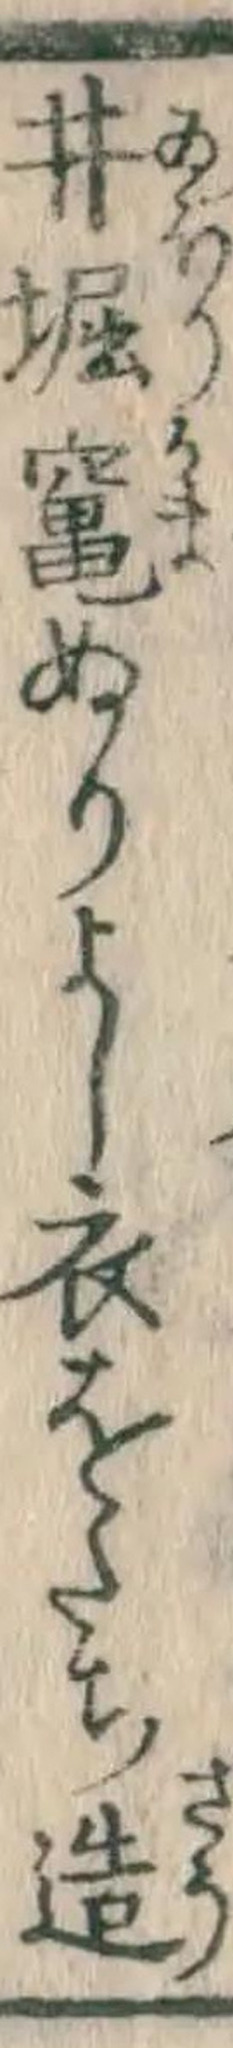井掘竈ぬりよし衣をたち造
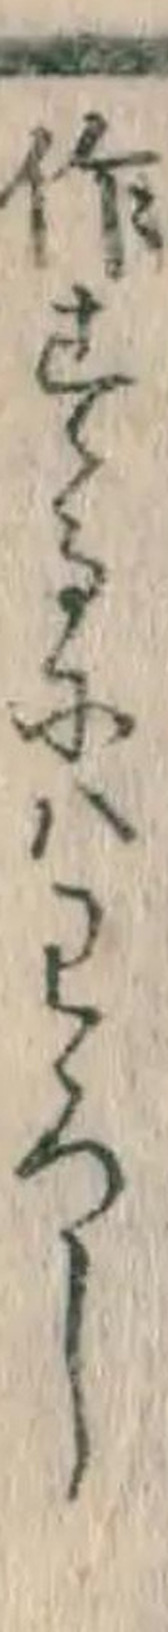作するにはわろし
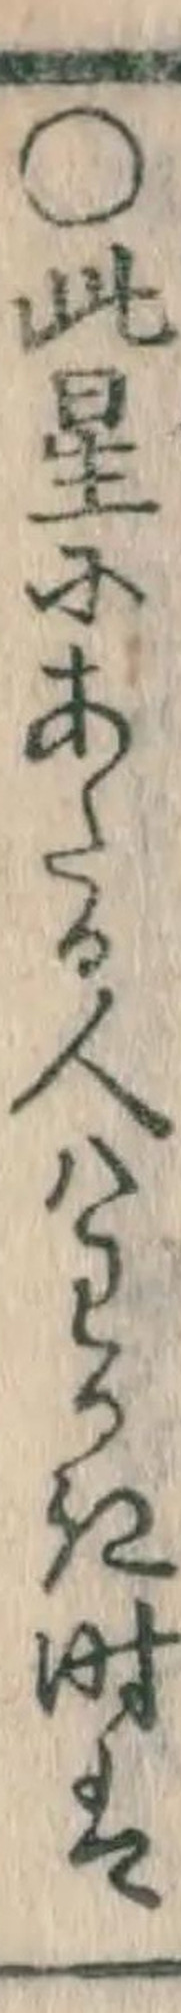○此星にあたる人はわかき時は

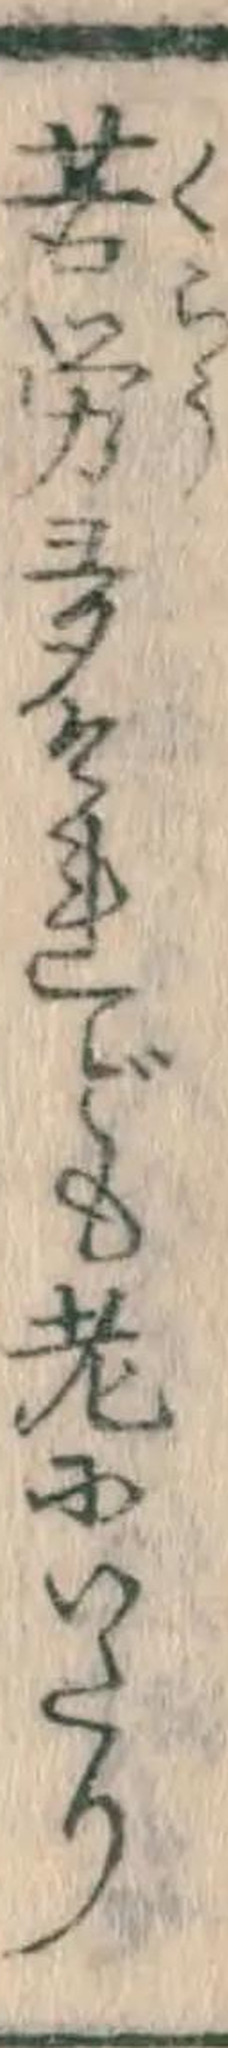苦労多けれども老にいたり
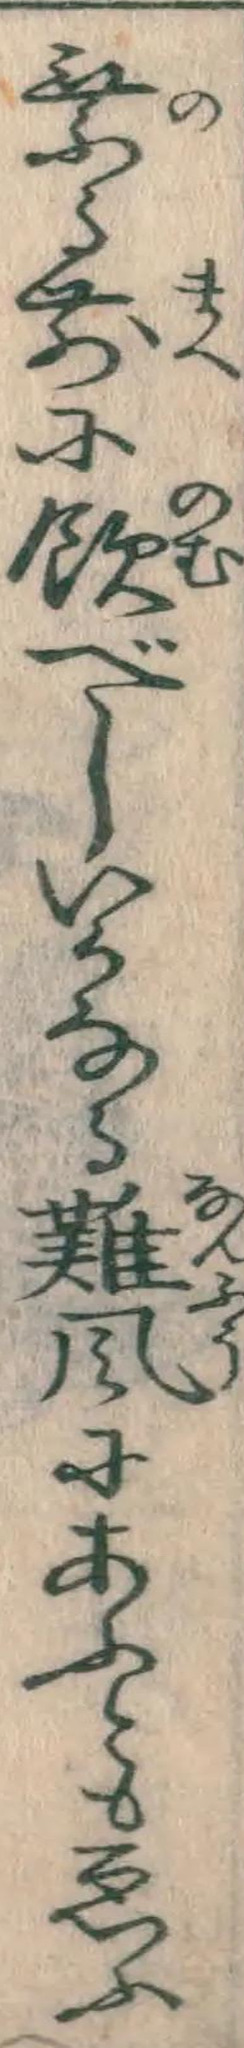乗る前に飲べしいかなる難風にあふともゑふ
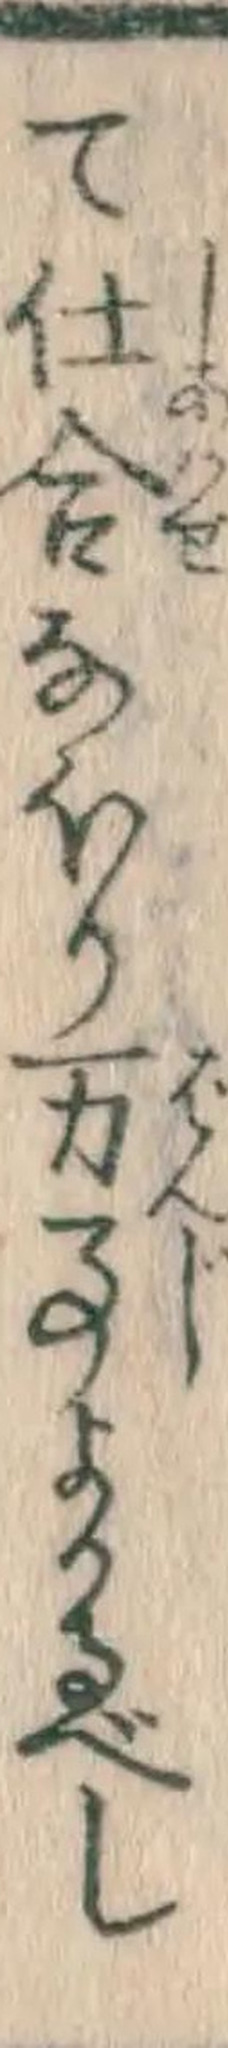て仕合なほり万事よかるべし
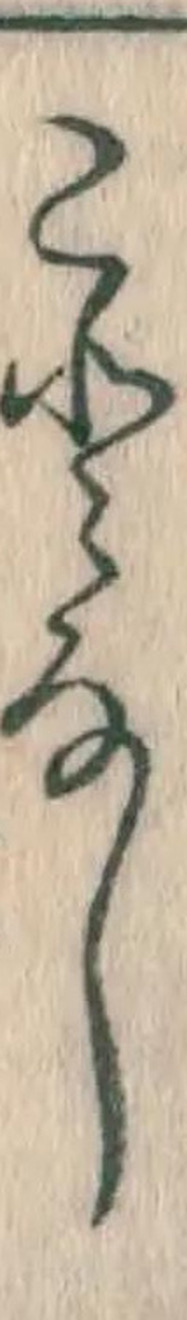ことなし
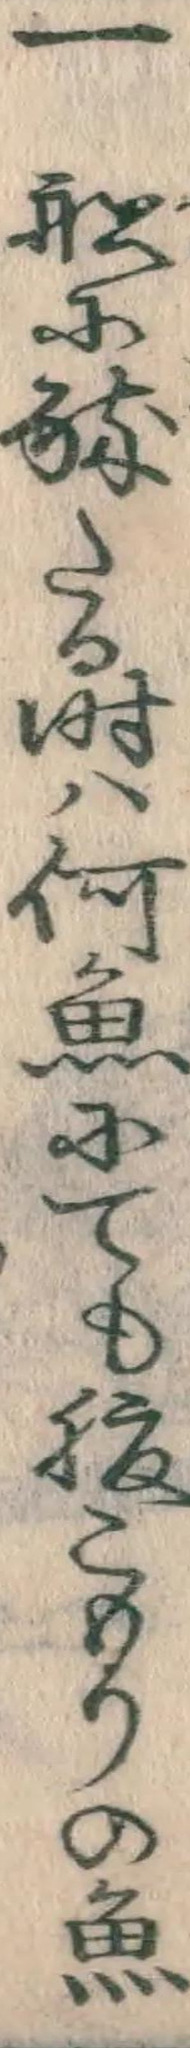一船に酔たる時は何魚にても腹こもりの魚
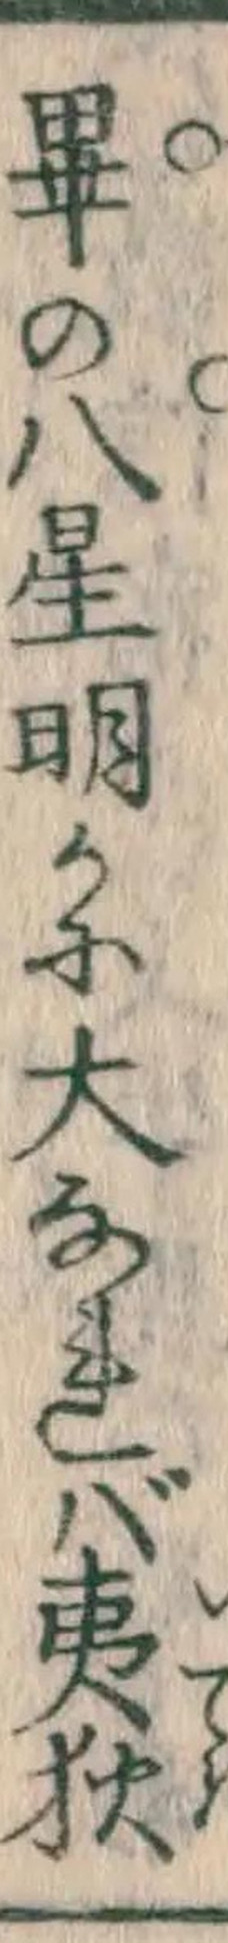畢の八星明かに大なれば夷狄
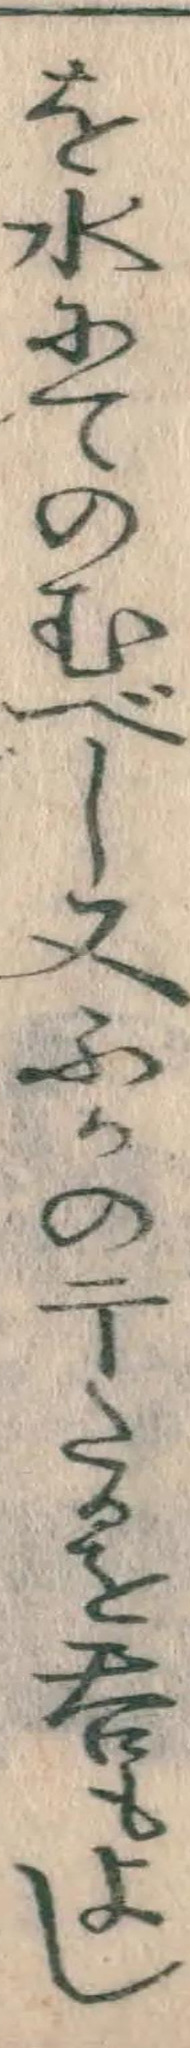を水にてのむべし又ふかの干たるを呑もよし
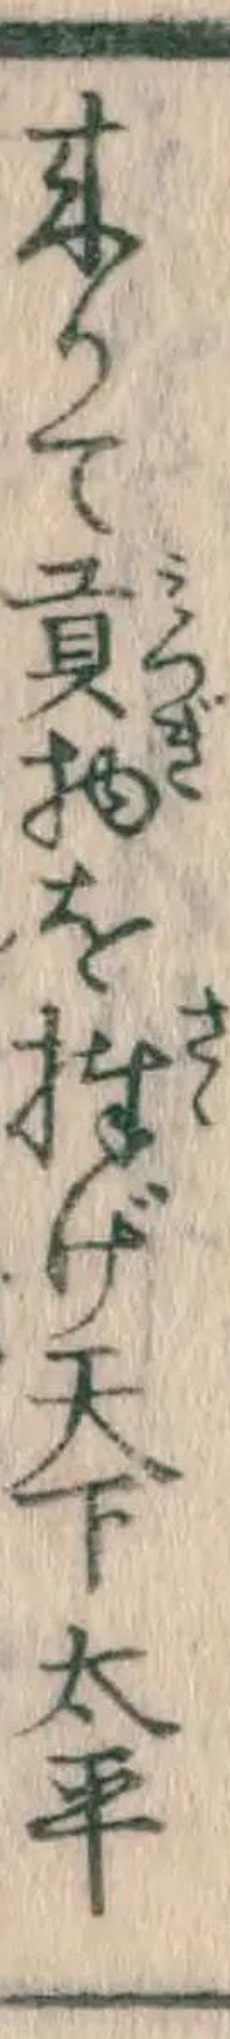来りて貢物を捧げ天下太平
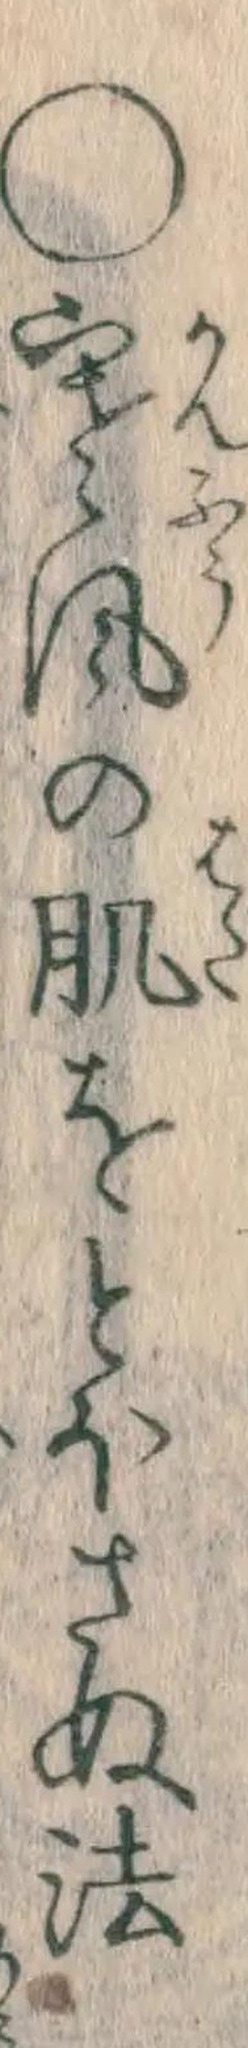○寒風の肌をとほさぬ法
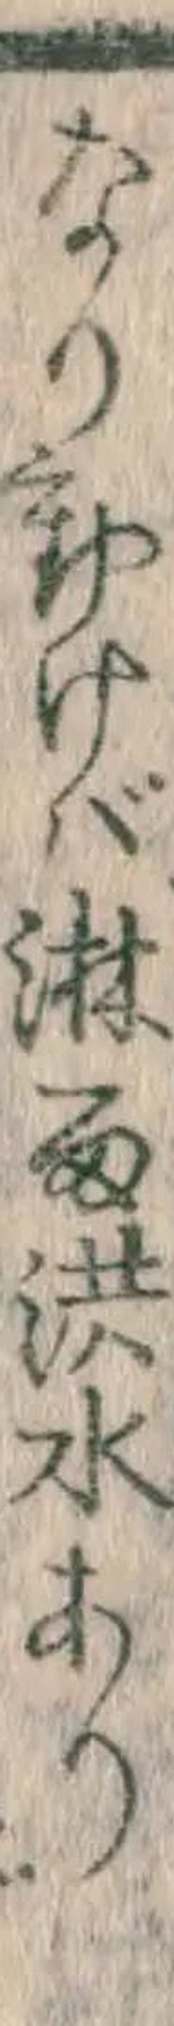なり動けば淋雨洪水あり
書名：広益秘事大全 3巻. [2]
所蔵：国立国会図書館 National Diet Library, JAPAN
